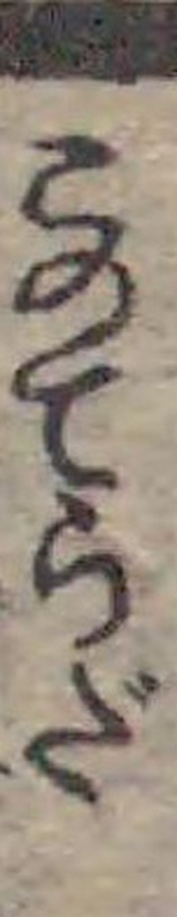このてらだ
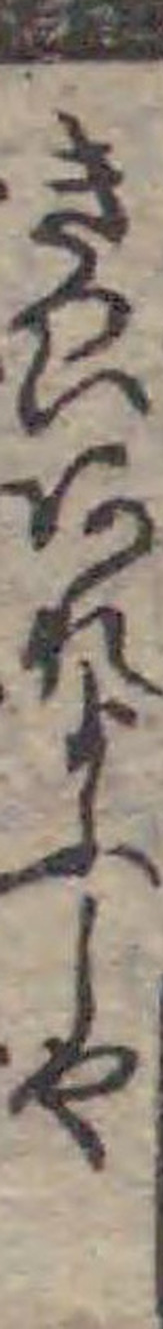きついあれよふしや
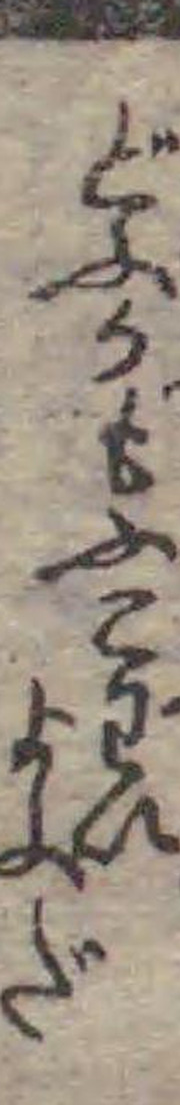どふかもふこわい
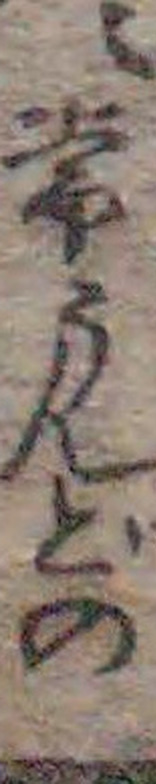常うんどの
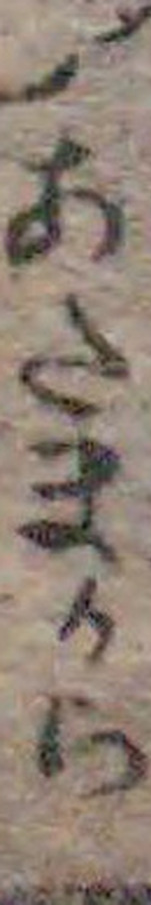あたまから
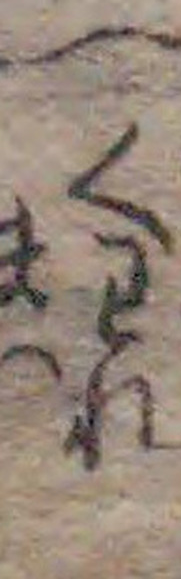くわれ

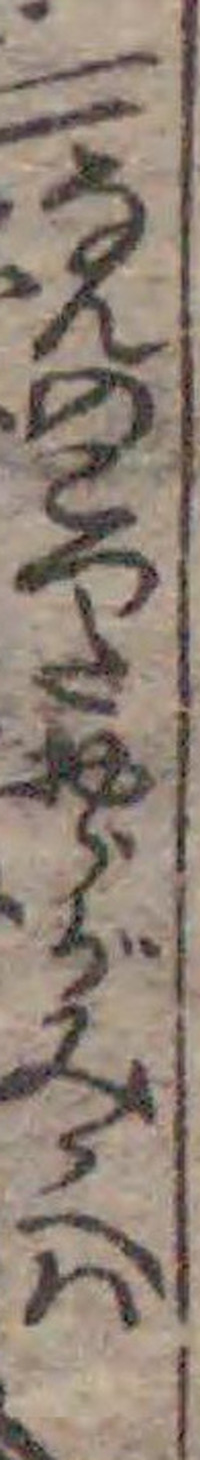なんのこつたおらがみゝへは
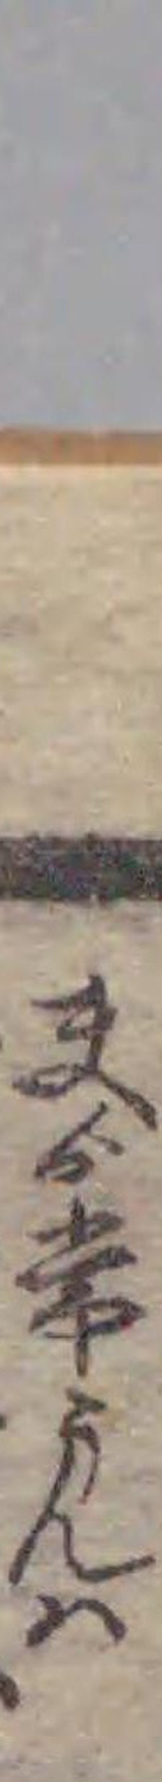夫ゟ常うんは
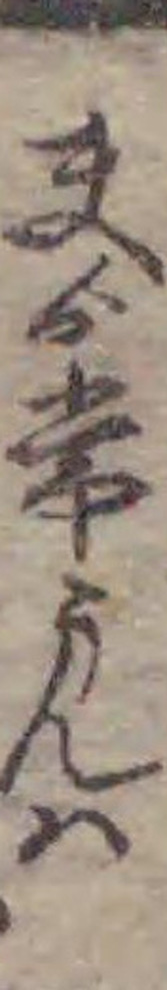夫ゟ常うんは
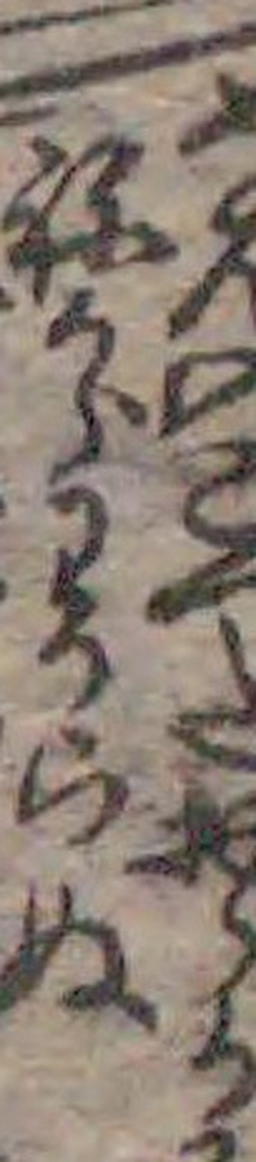ねからわからぬ
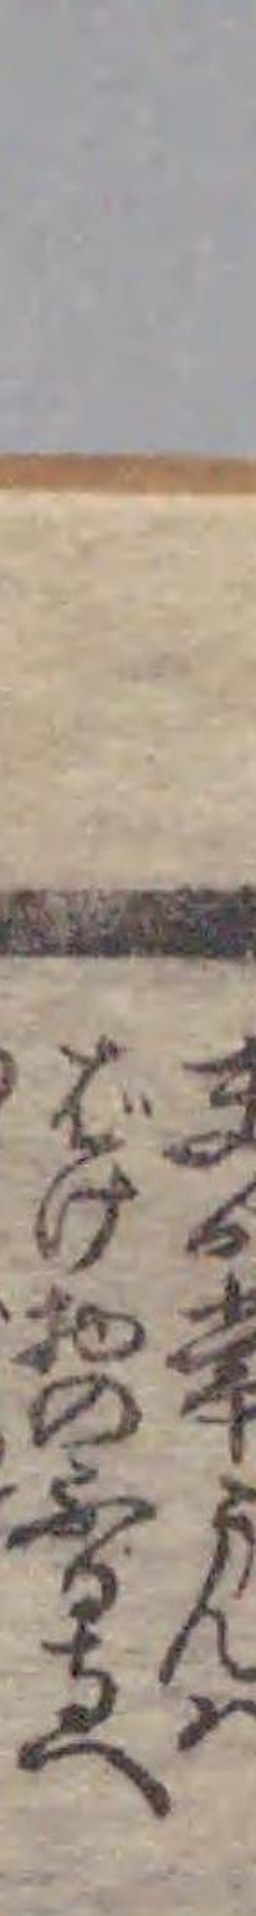ばけ物のふる寺へ
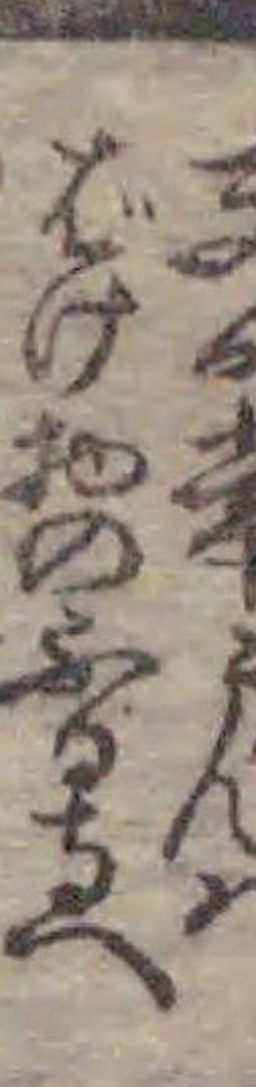ばけ物のふる寺へ
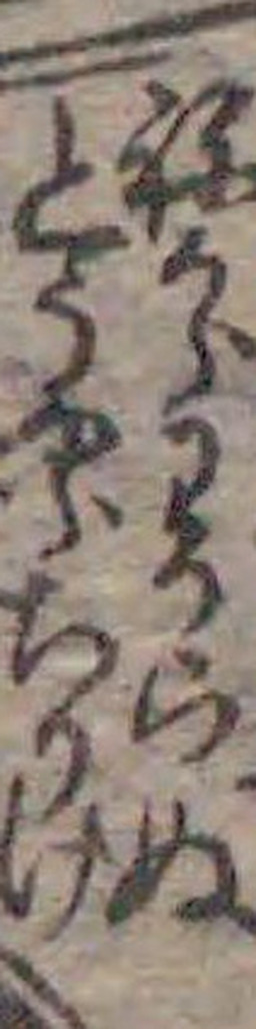とうやらちりけ
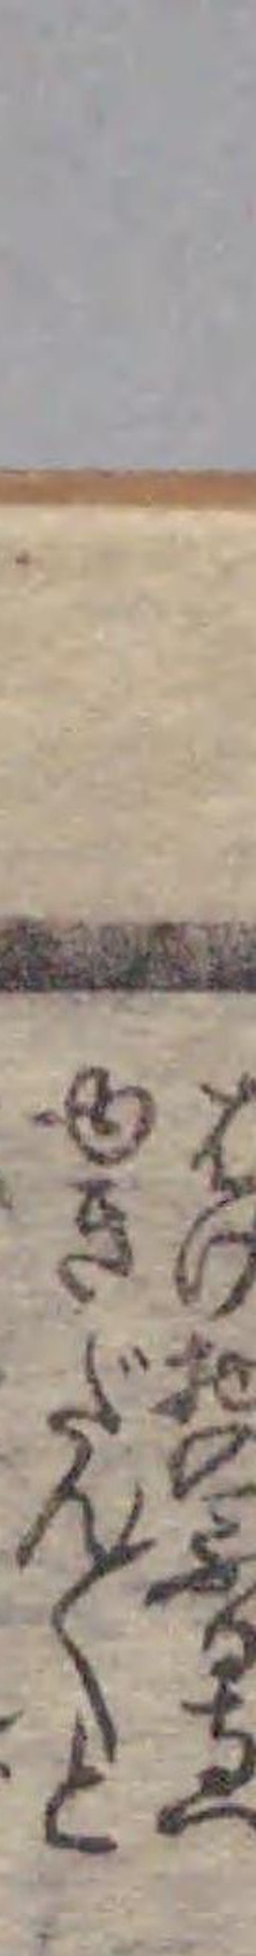ゆきだん〳〵と
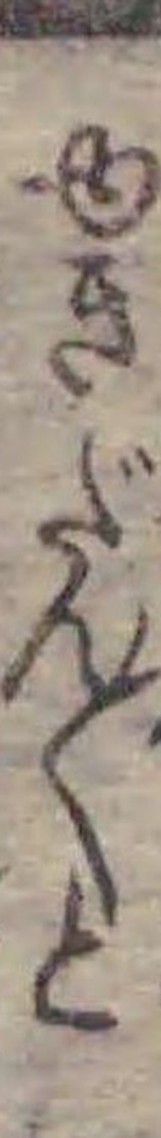ゆきだん〳〵と
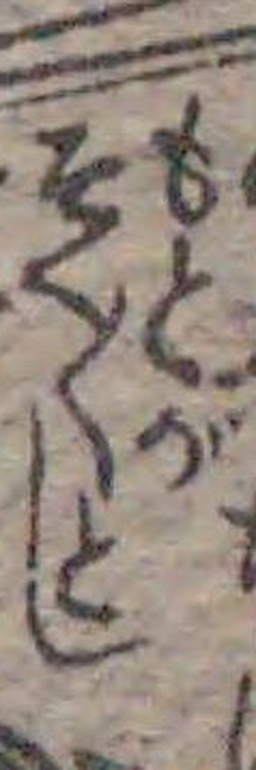そく〳〵とし
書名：歌の化物一寺再興 : 2巻
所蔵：国立国会図書館 National Diet Library, JAPAN
